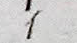1
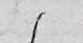1
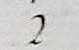2
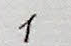1
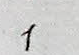1
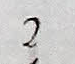2
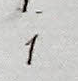1
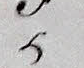5
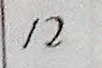12
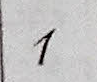1
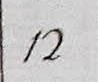12
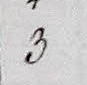3
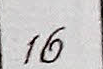16
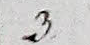3
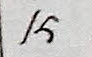15
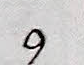9
